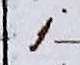1
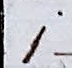1
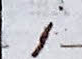1
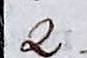2
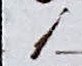1
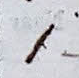1
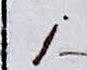1
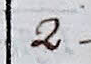2
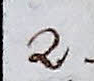2
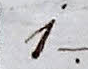1
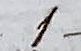1
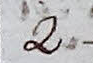2
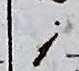1
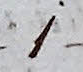1
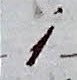1
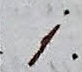1
